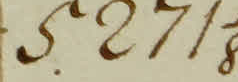5271
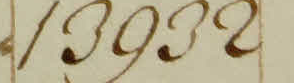13932
